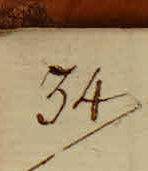34
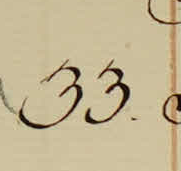33.
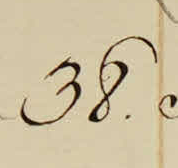38.
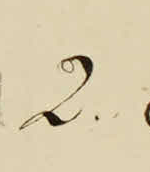2.
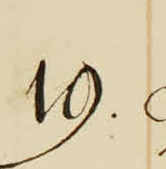19.
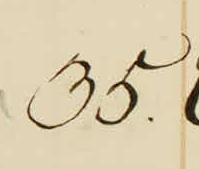35.
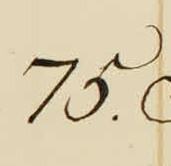75.
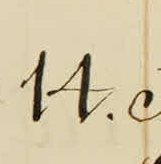14.
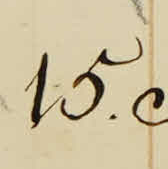15.
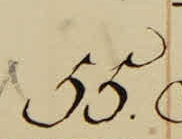55.
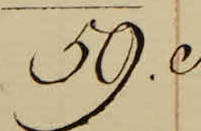59.
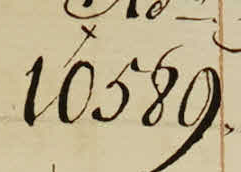10589
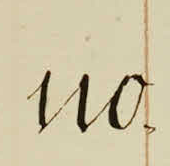110
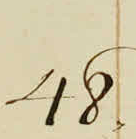48
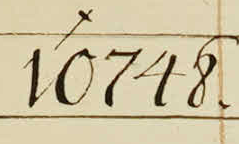10748
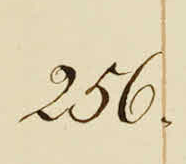256
